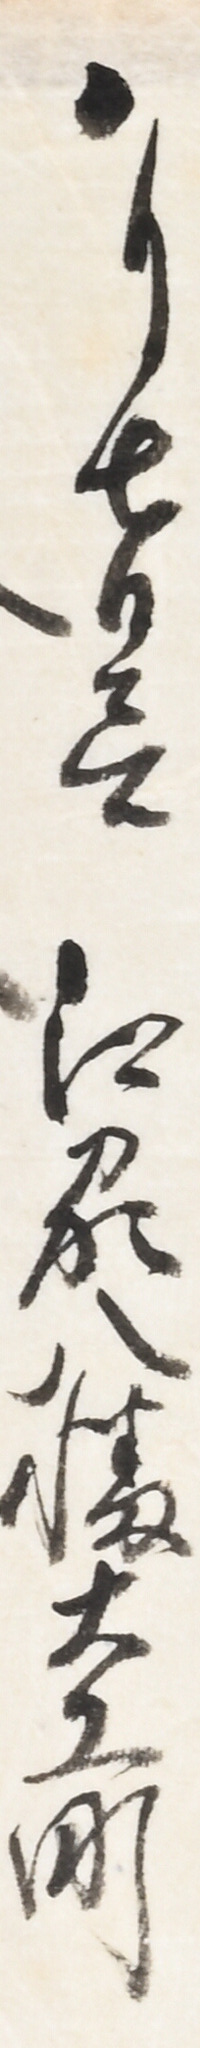八月七日着江州八幡大工町
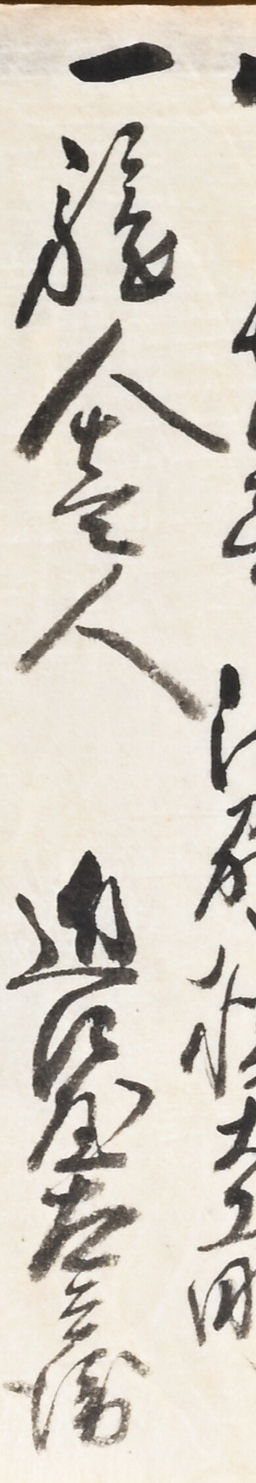一旅人壱人近江屋太兵衛
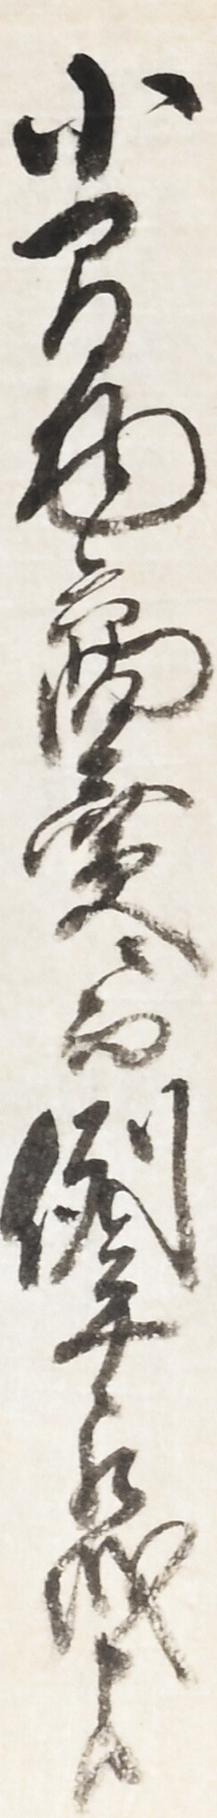小間物商売ニ而例年罷越申候
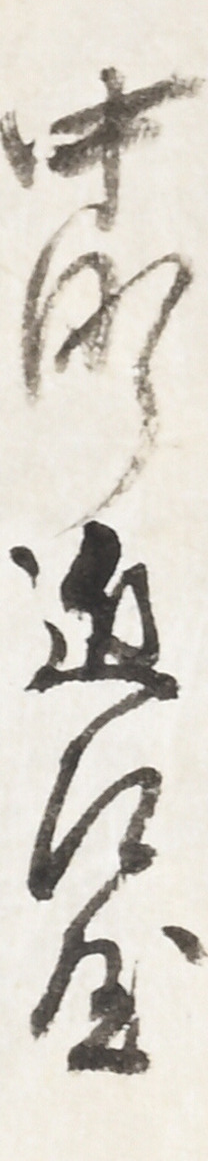中町近江屋
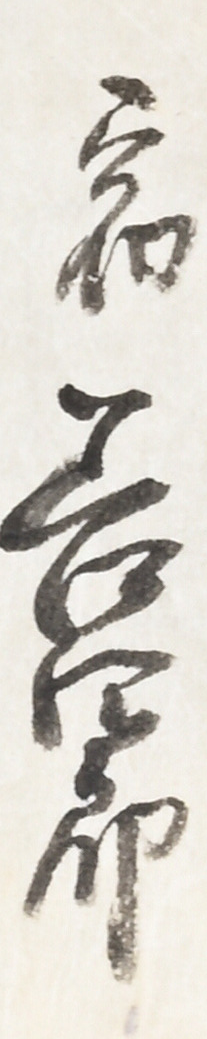宿善四郎
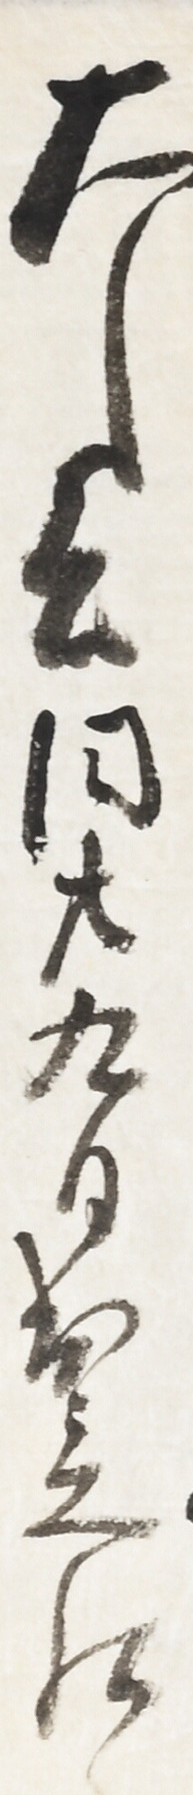右之者同廿九日出立仕候
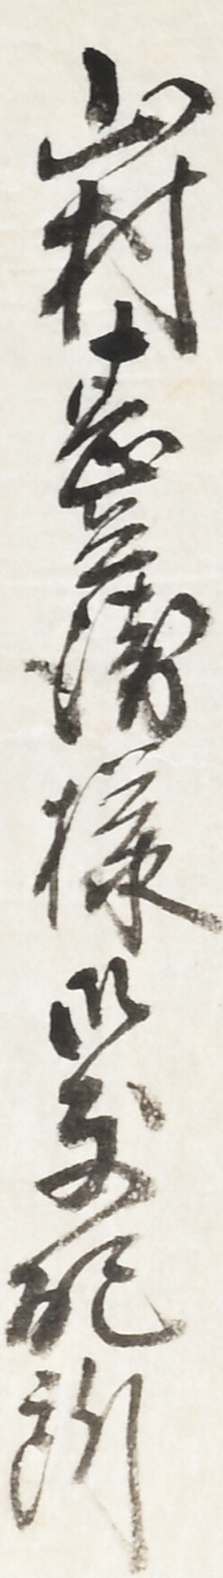山村甚兵衛様御支配所
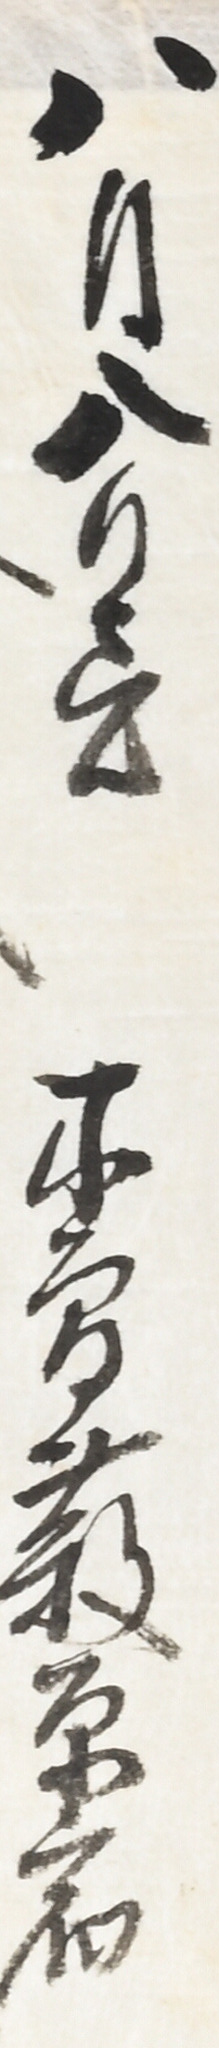八月八日着木曽藪原宿
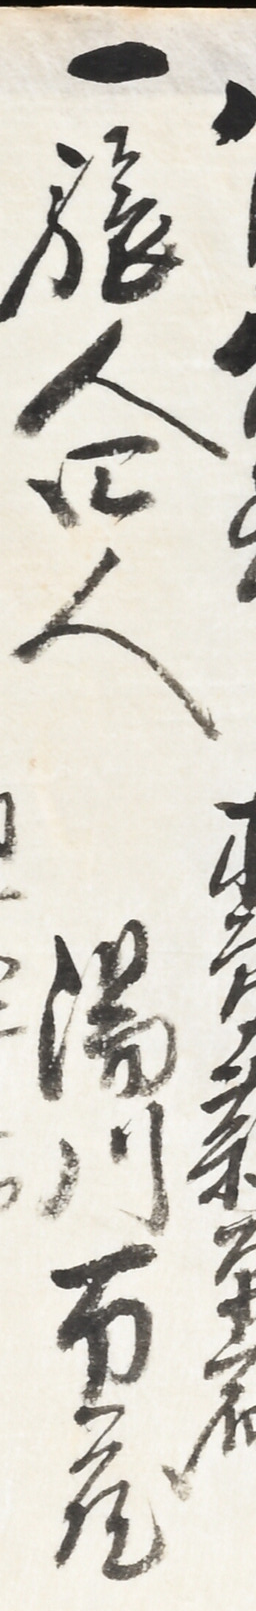一旅人四人湯川万蔵
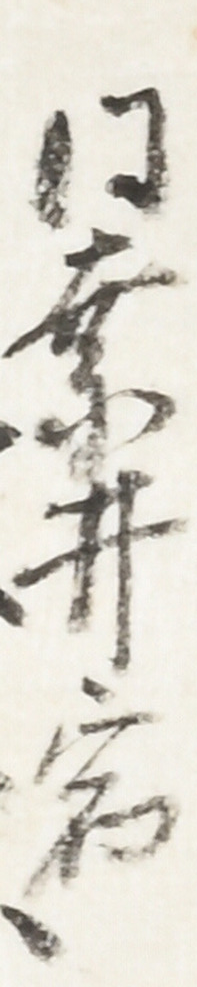同奈井宿
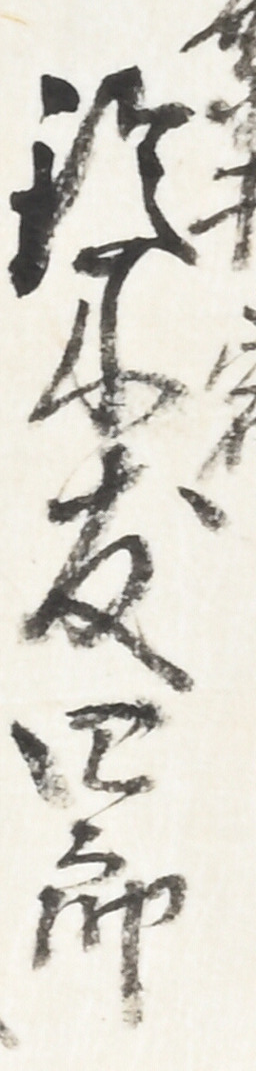鈴木友四郎
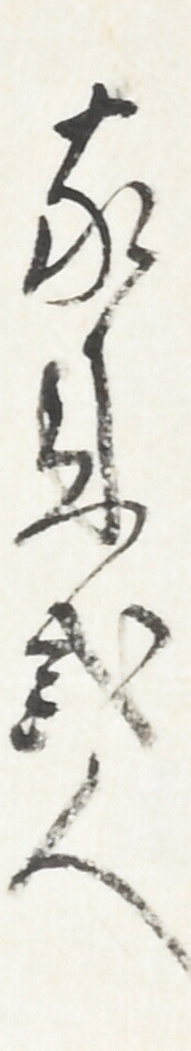家来弐人
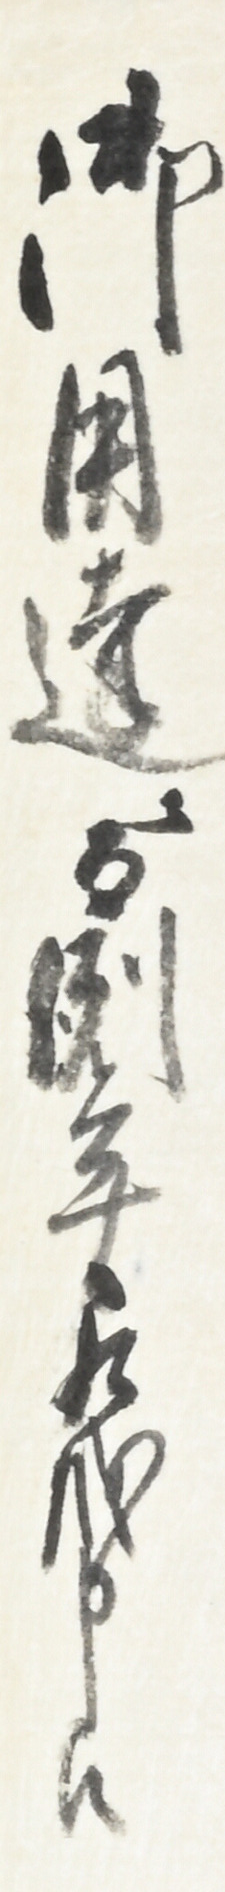御用達ニ而例年罷越申候
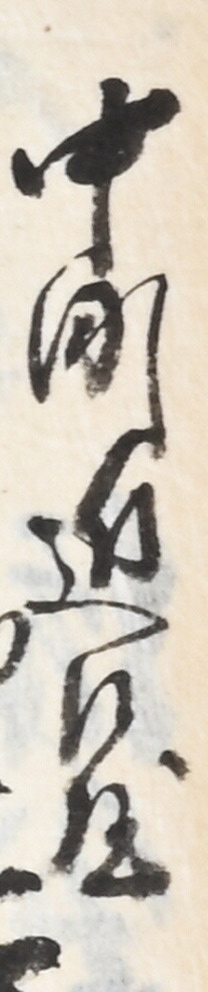中町近江屋
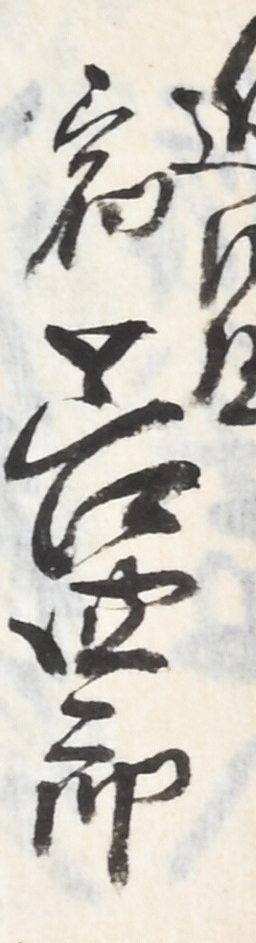宿善四郎
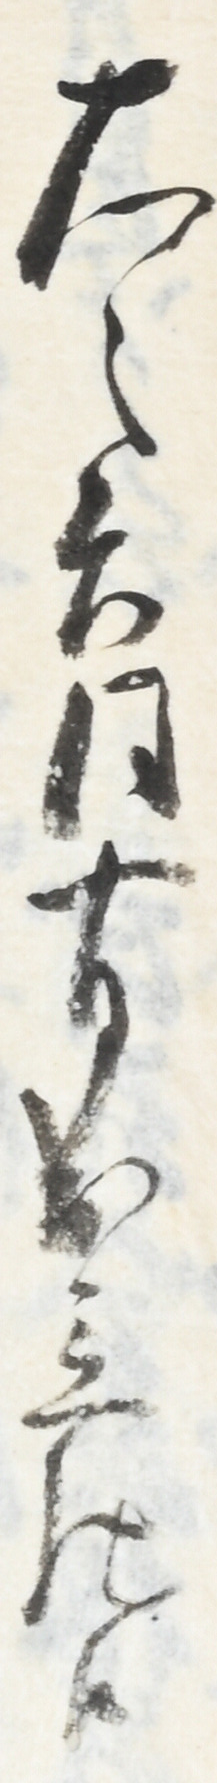右之者同十七日出立仕候
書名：旅人泊控帳
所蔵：伊那市立高遠町図書館・合同会社AMANE
